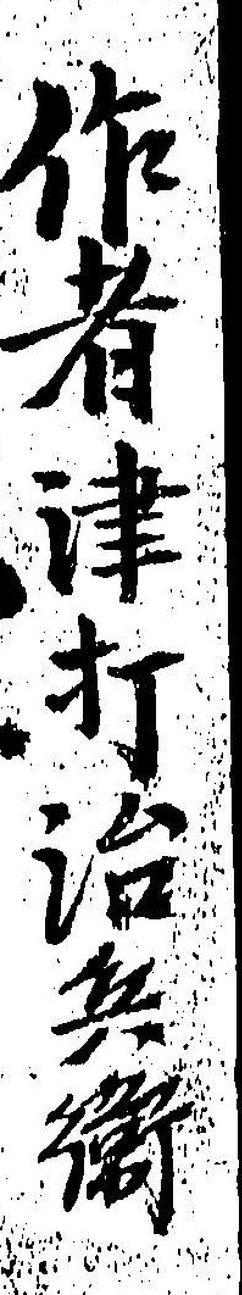作者津打治兵衛
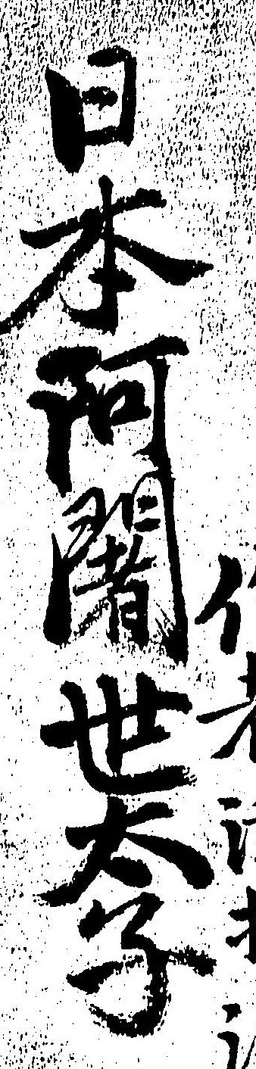日本阿闍世太子
